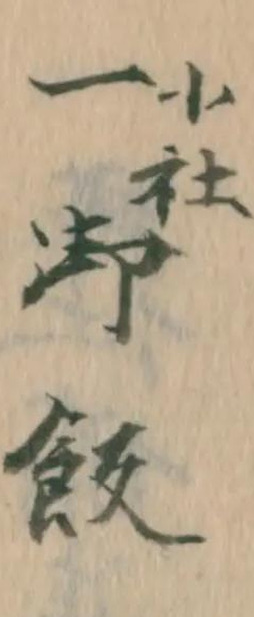一御飯
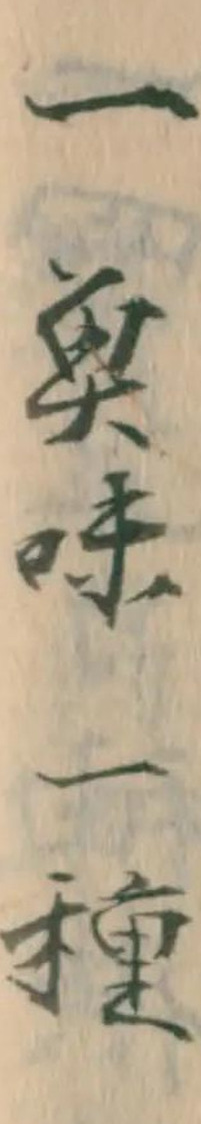一魚味一種
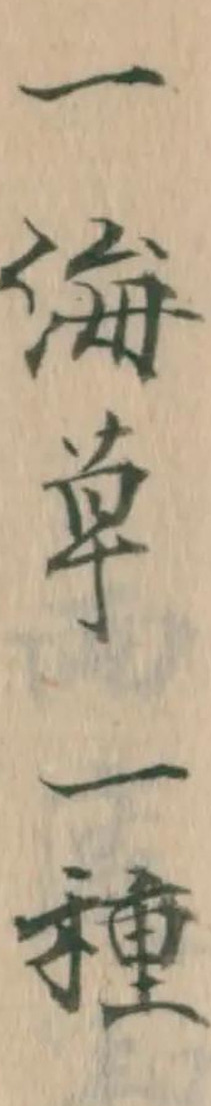一海草一種
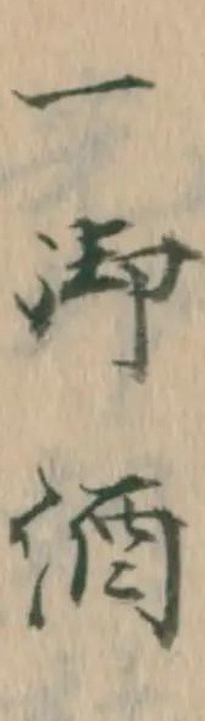一御酒
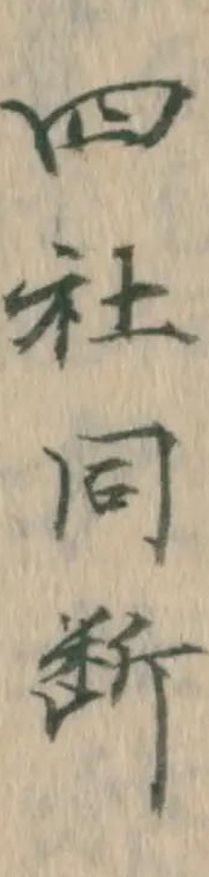四社同断
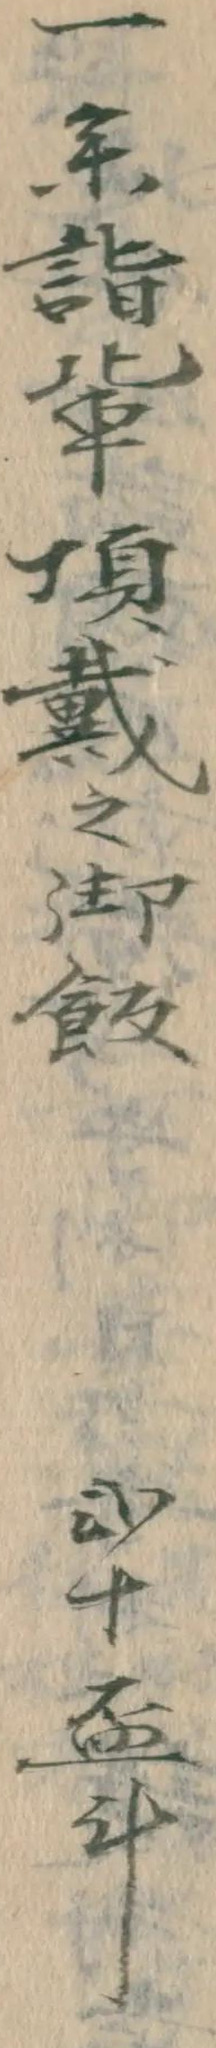一参詣輩頂戴之御飯弐十盃計
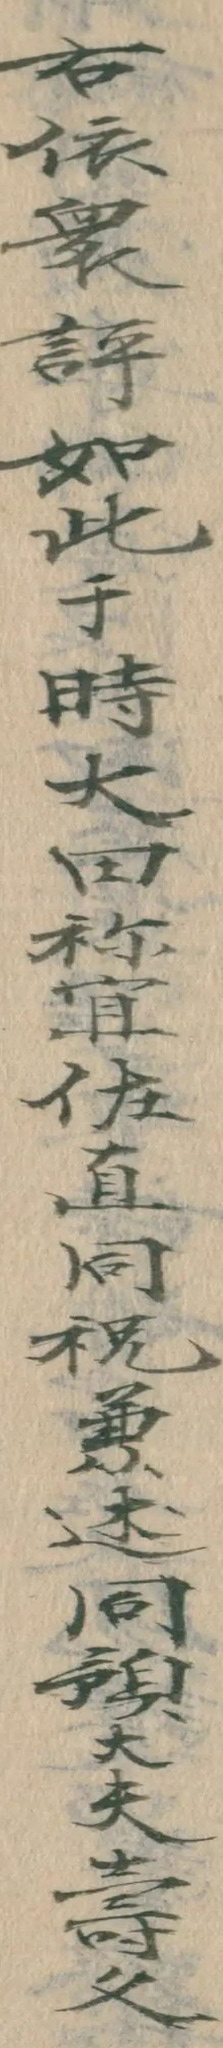右依衆評如此于時大田祢宜佐直同祝兼述同預大夫寿久
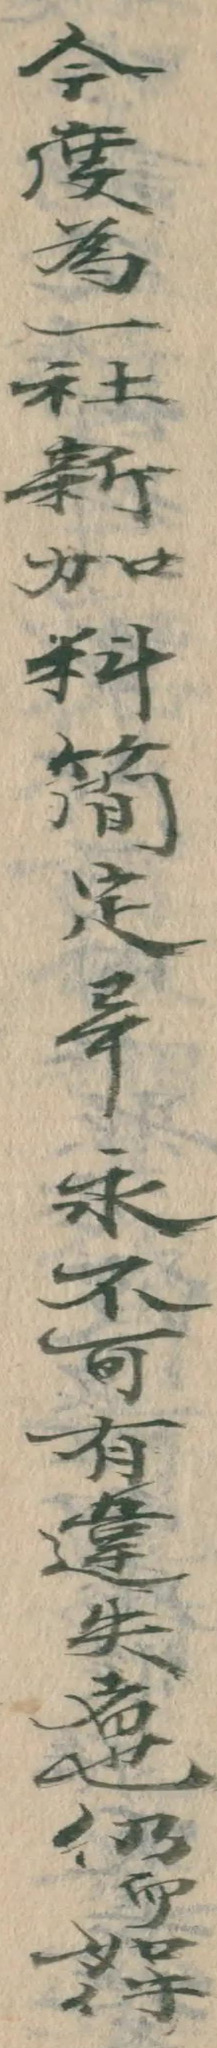今度為一社新加料簡定畢永不可有違失者也仍而如件
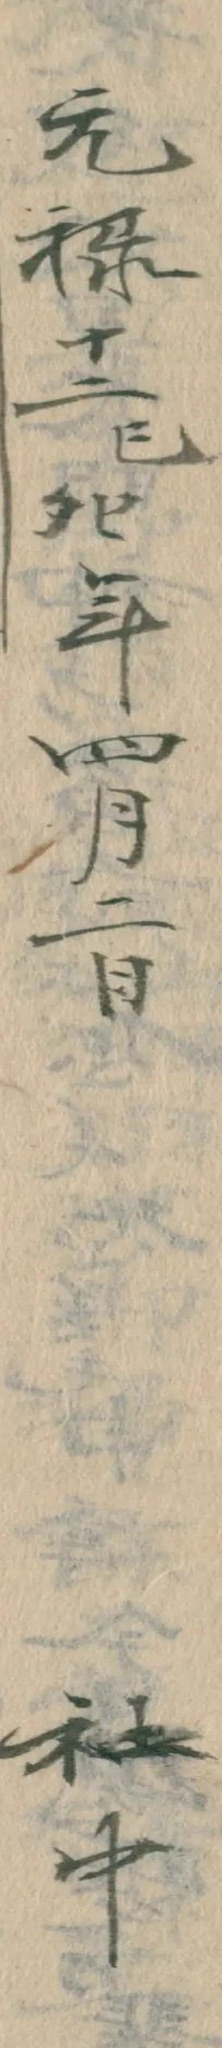元禄十二己卯年四月二日社中

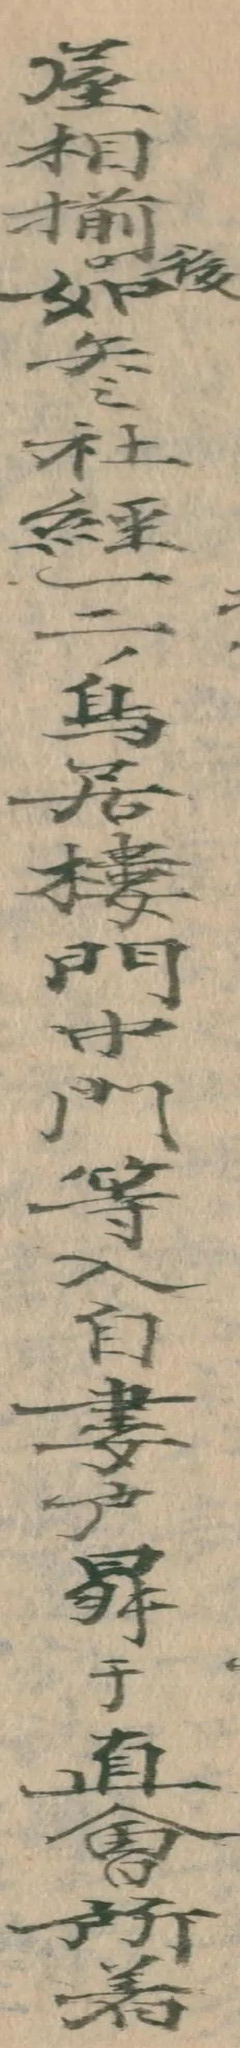屋相揃◦如参社経一二ノ鳥居楼門中門等入自妻戸昇于直会所着
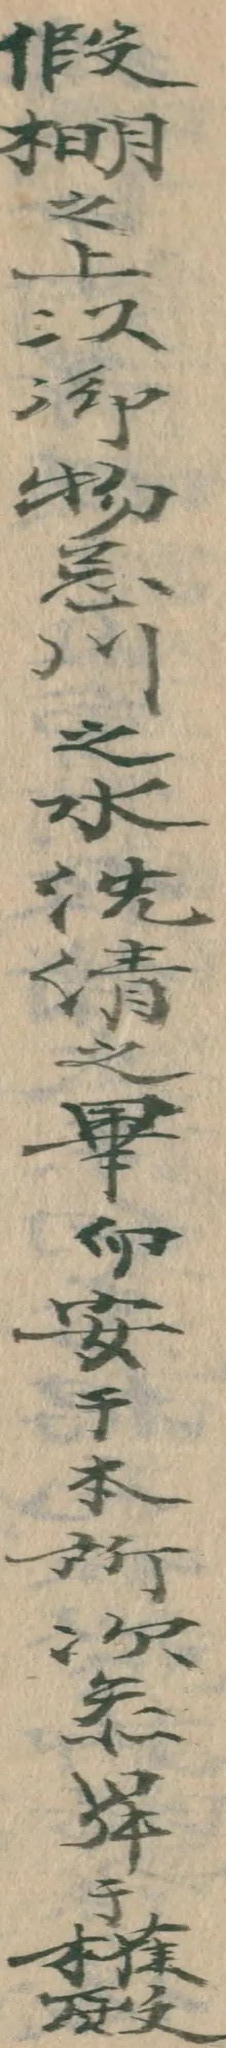仮棚之上以御物忌川之水洗清之畢而安于本所次参昇于権殿
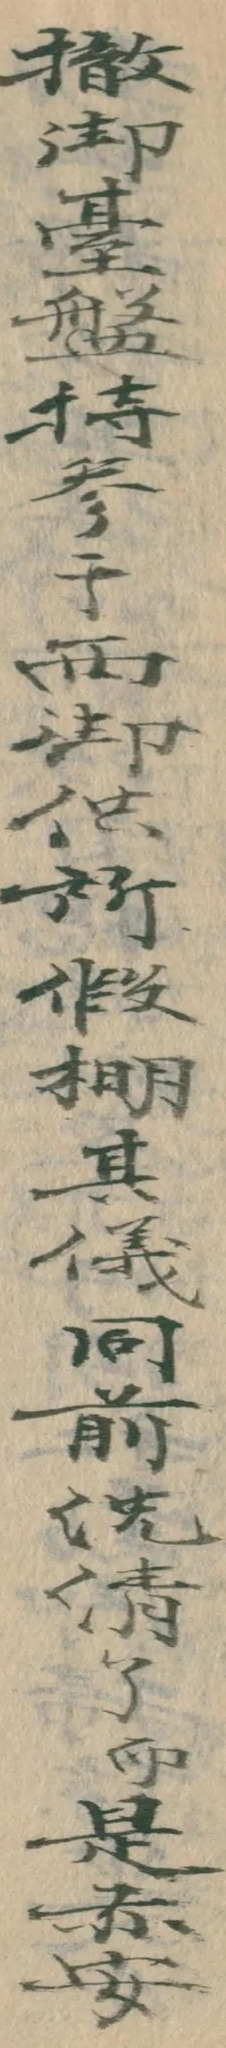撤御台盤持参于西御供所仮棚其儀同前洗清了而是亦安

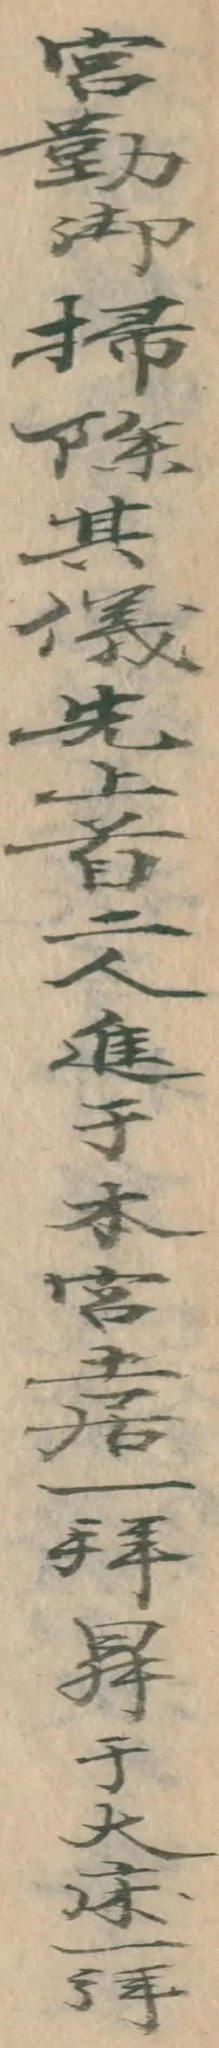宮勤御掃除其儀先上首二人進于本宮土居一拝昇于大床一拝
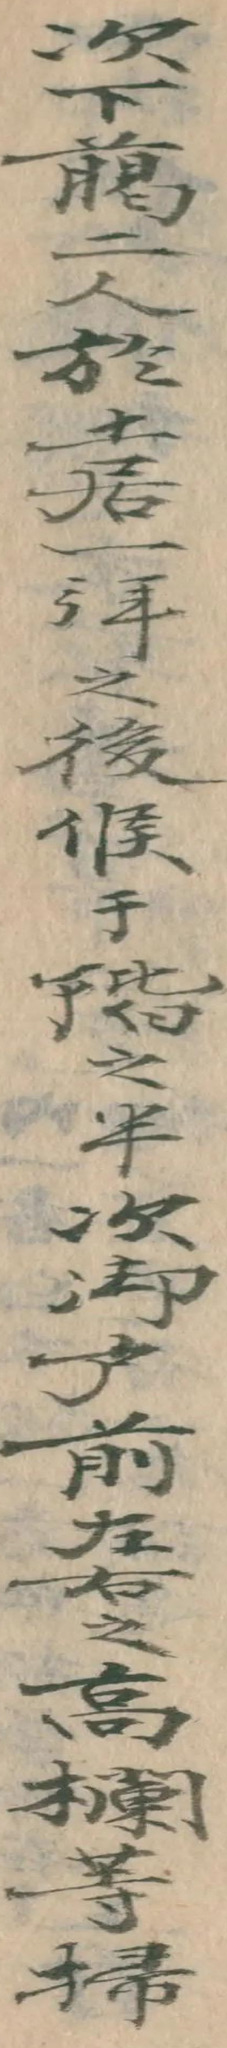次下臈二人於土居一拝之後候于階之半次御戸前左右之高欄等掃
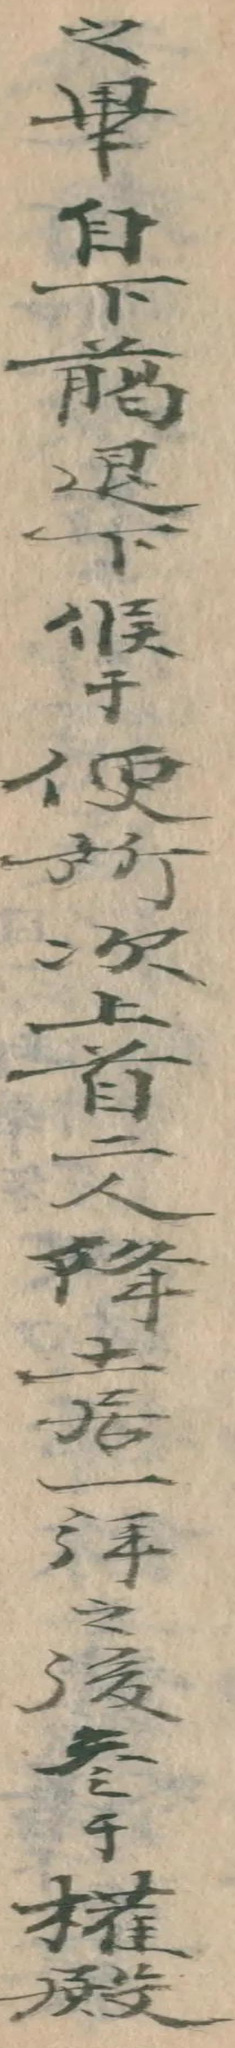之畢自下臈退下候于便所次上首二人降土居一拝之後参于権殿
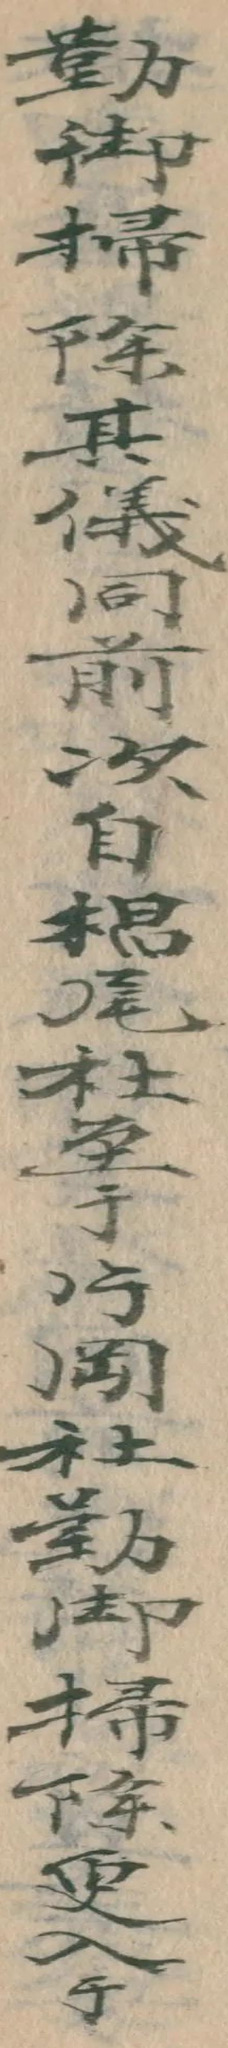勤御掃除其儀同前次自椙尾社至于片岡社勤御掃除更入于
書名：賀茂社記録. 第9冊
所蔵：国立国会図書館 National Diet Library, JAPAN
